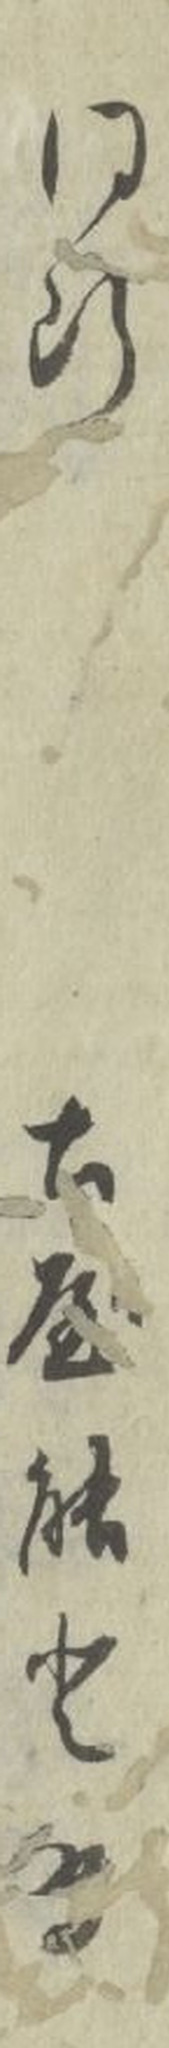同断土屋能登守
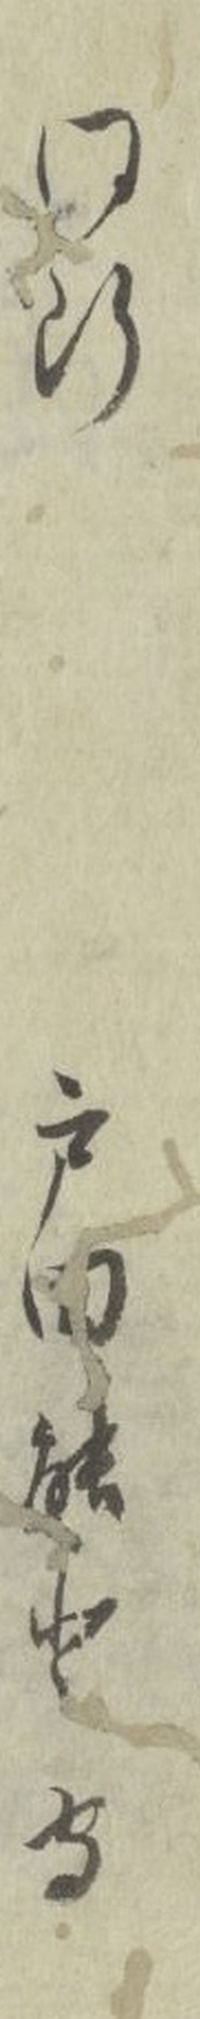同断戸田能登守
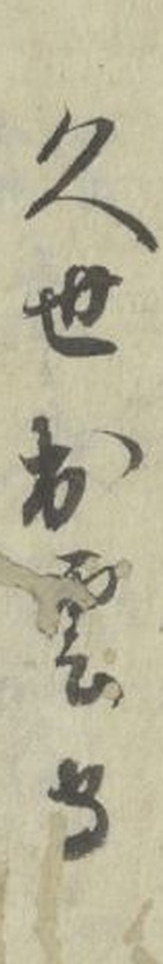同断久世出雲守
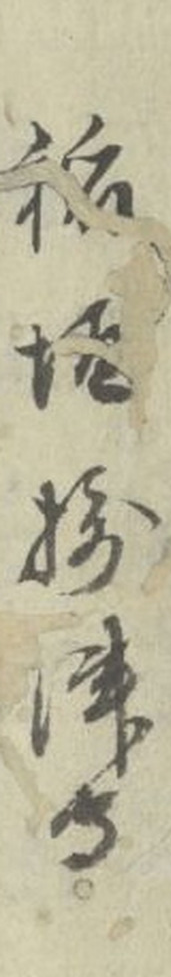同断稲垣摂津守
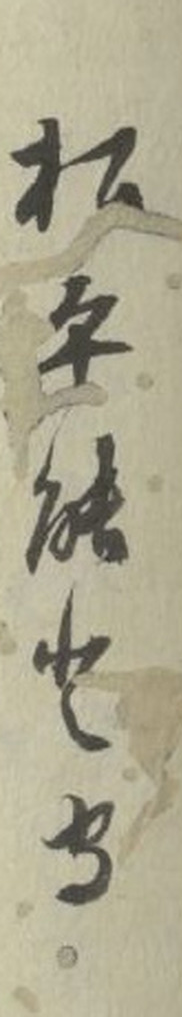同断松平能登守
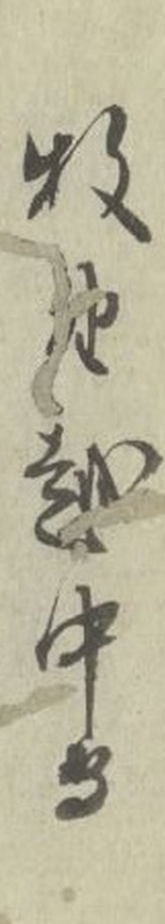同断牧野越中守

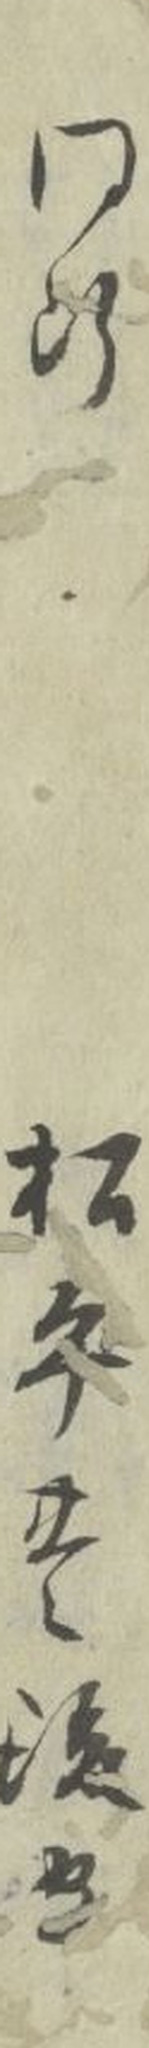同断松平豊後守
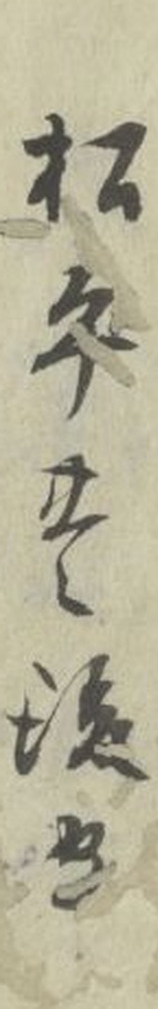同断松平豊後守
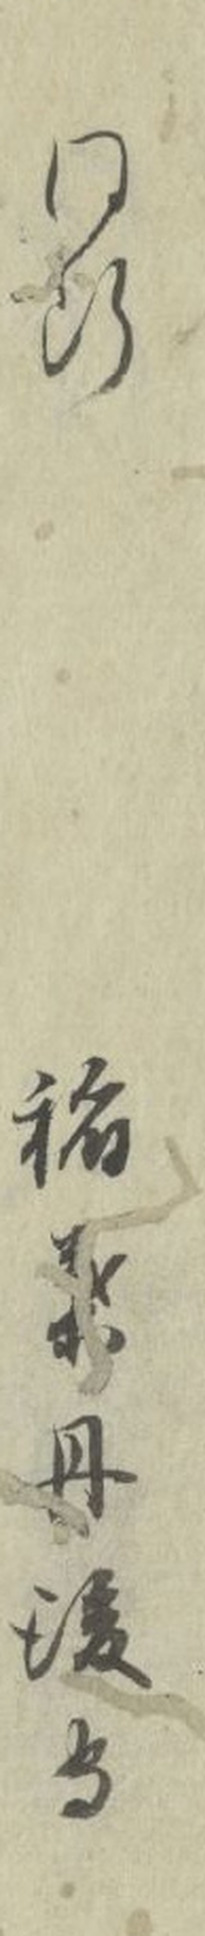同断稲葉丹後守
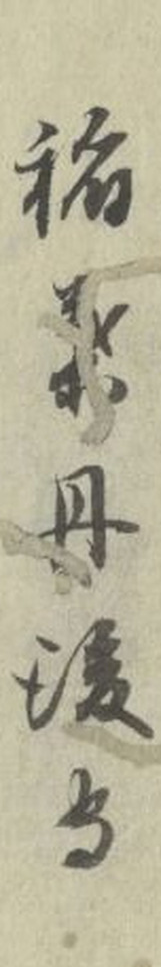同断稲葉丹後守
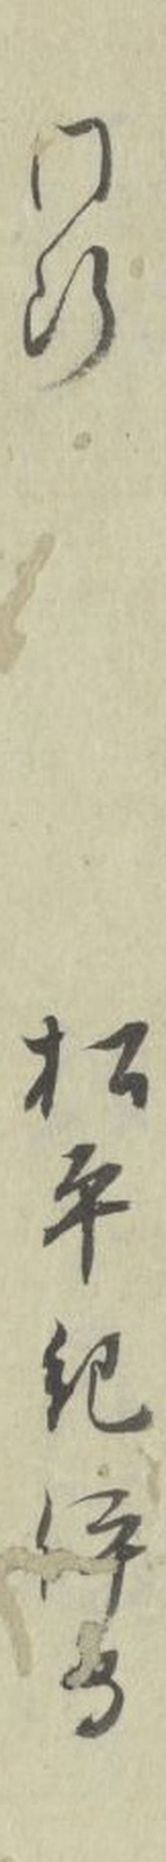同断松平紀伊守
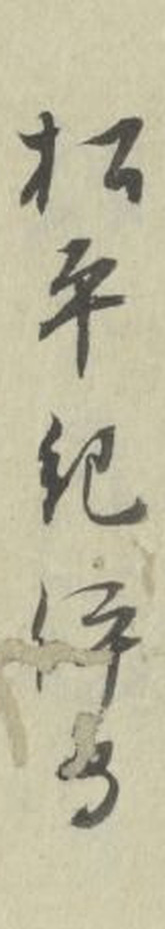同断松平紀伊守
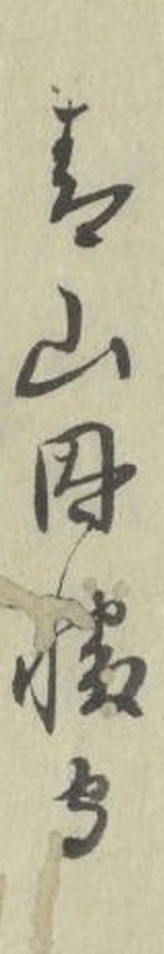同断青山因幡守
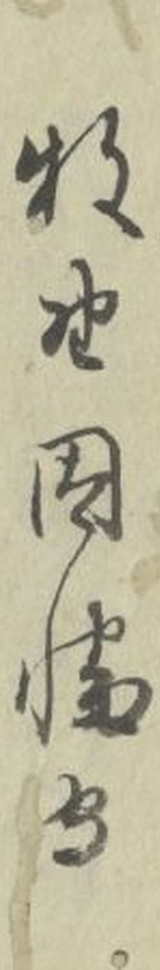同断牧野因幡守
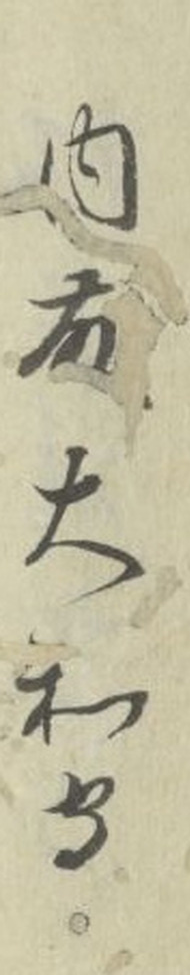同断内藤大和守
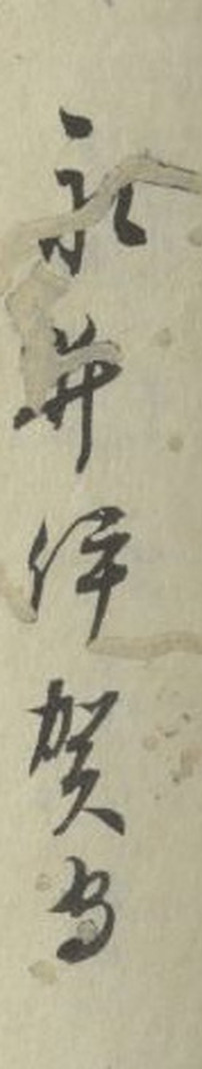同断永井伊賀守
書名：琉球来朝記 自一至七
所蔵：University of the Ryukyus Library
